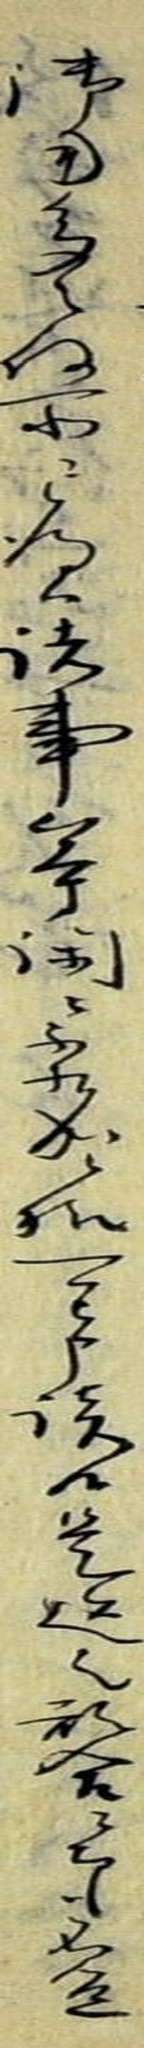御用多之役所ニ候得ハ諸事等閑ニ不相成候様可被申談候是迄之形合ニ而も不宜
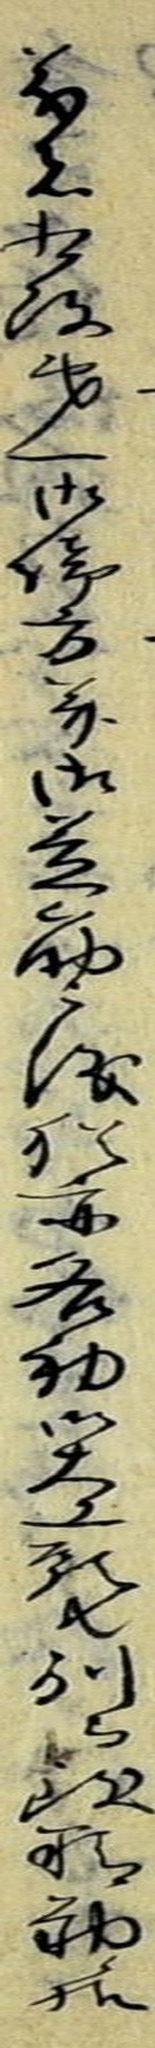義者相改第一御締方并御益筋之儀猶亦各初大工頭共別而致精勤候様
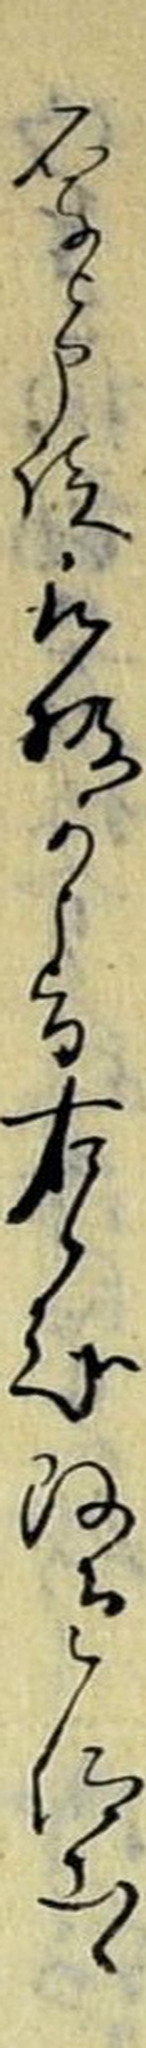厚被申渡取扱可申旨右之趣改而被仰出候
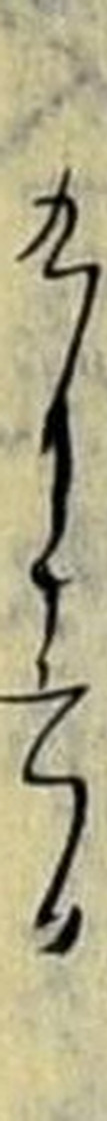九月十六日
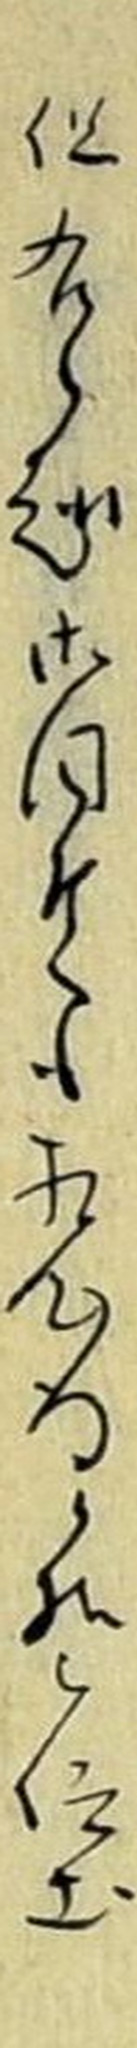但右之趣御目付へも相心得候様被仰出
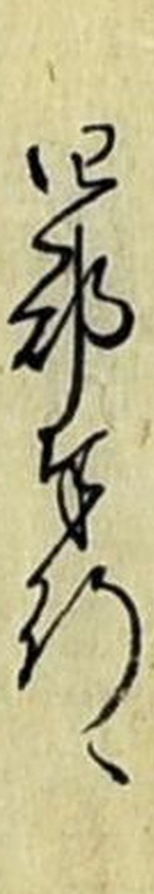四郡奉行へ
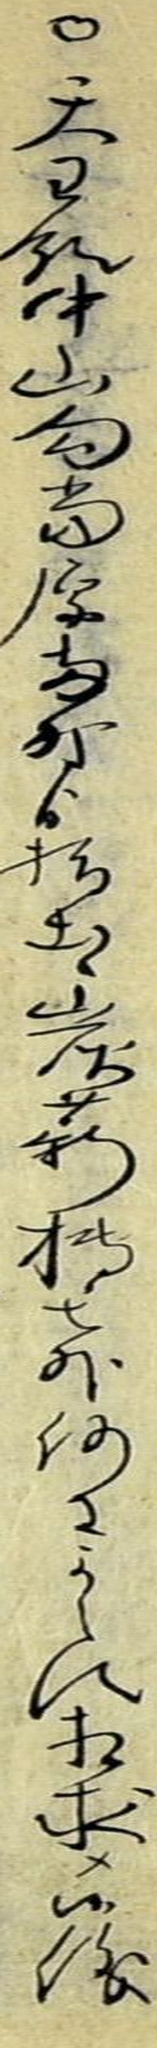〇天主領中山勾当原両町ゟ指出候炭薪樽其外何によらす相求メ候儀
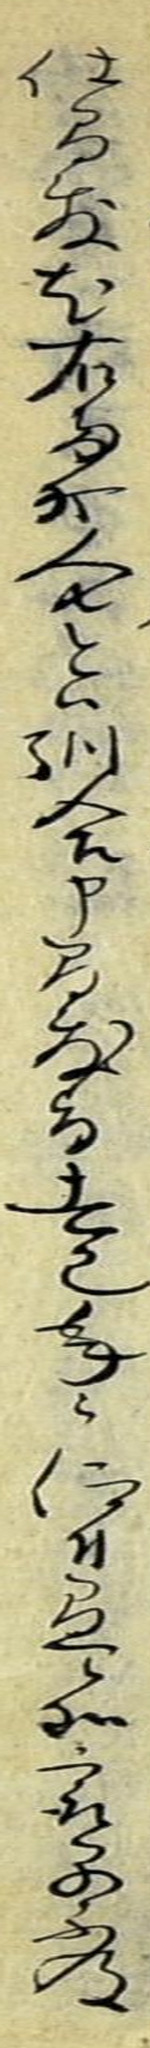仕間敷尤右両町人共とハ馴合申間敷旨去巳年被仰付置候処最早不及
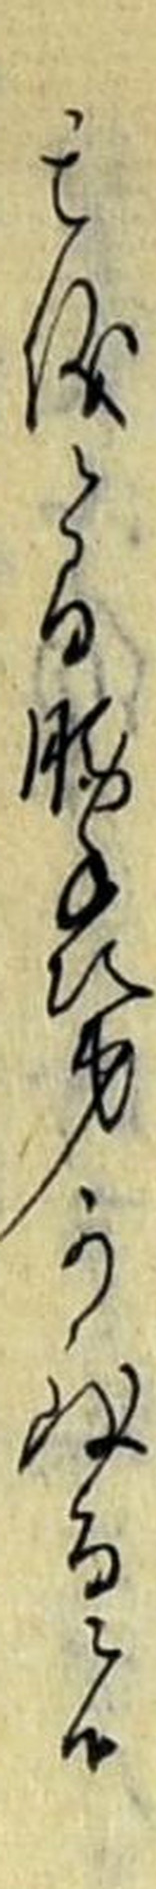其儀候間勝手次第可致旨ニ候
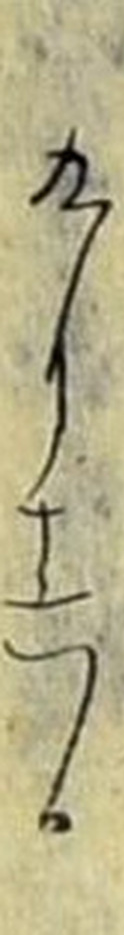九月十六日

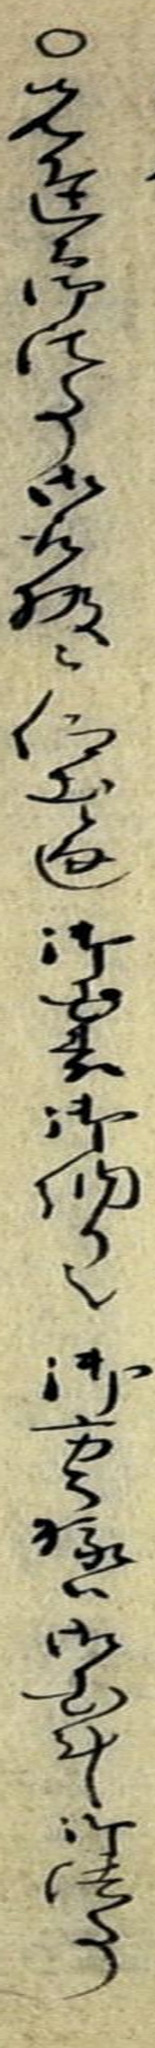〇先達而御法事御取扱被仰出之通御国表御納り之御方々様ハ御国計御法事
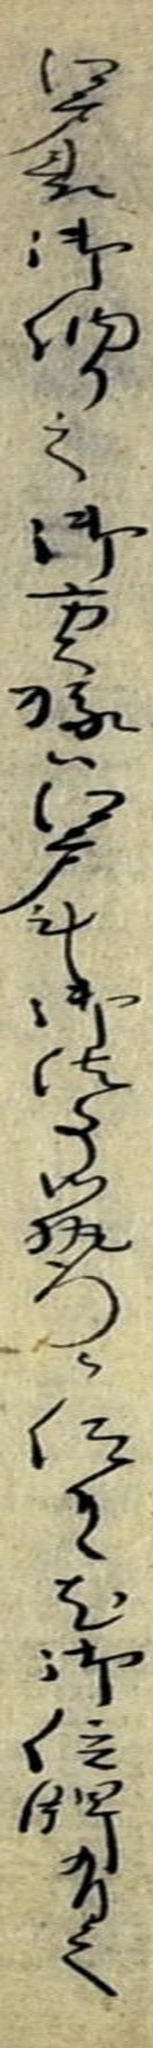江戸表御納り之御方々様ハ江戸計御法事御執行被仰付候尤御位牌有之
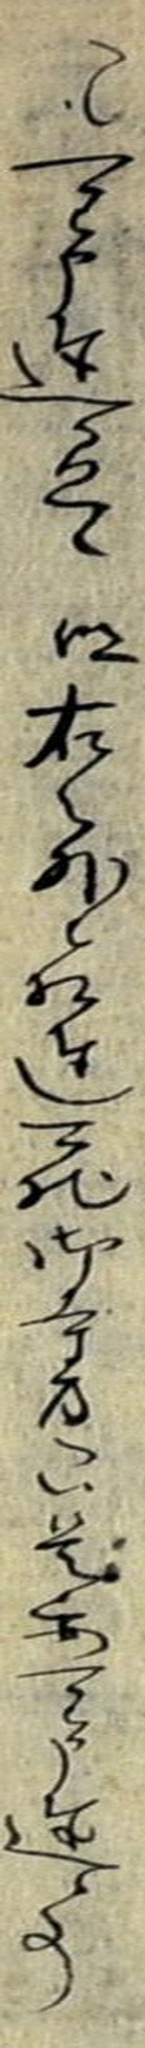へも可被申達置候但右之外被相達可然御寺方へハ是亦可被申達候事
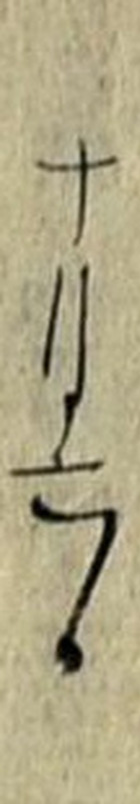十月六日
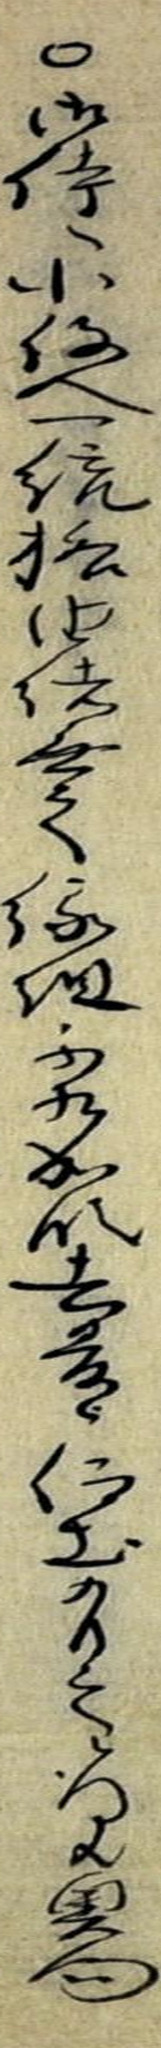〇御侍へ小役人一統格由緒無之縁組不相成段去夏被仰出有之候得共奥向
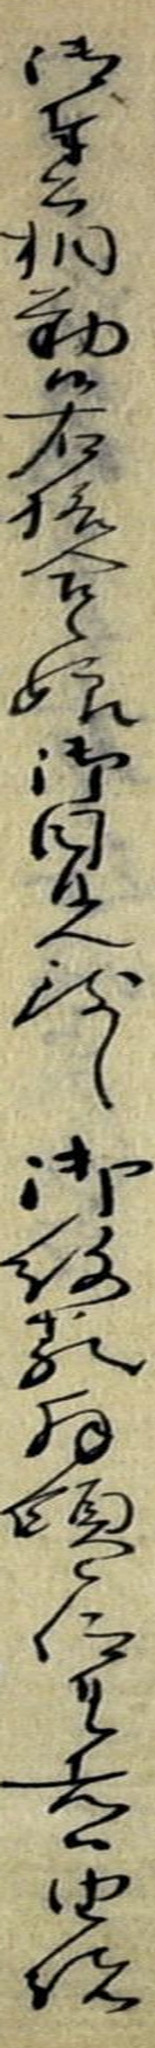御奉公相勤候右格合之娘御目見致し御紋類拝領被仰付候者ハ由緒
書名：命令之部 三
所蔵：福井県文書館 Fukui Prefectural Archives
